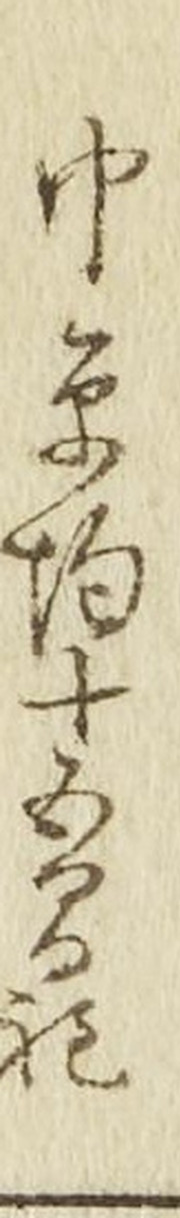巾平均十五間程

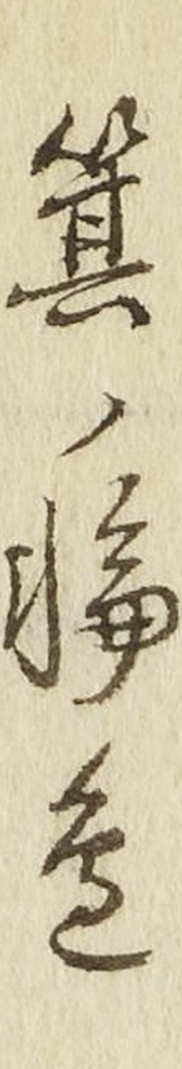箕ノ輪辺
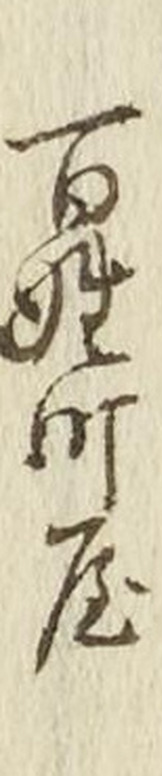百姓町屋
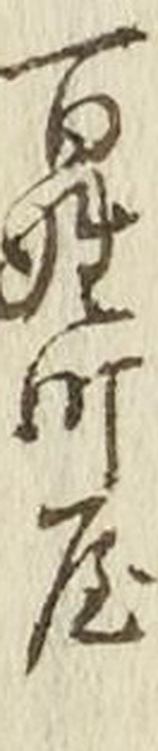百姓町屋

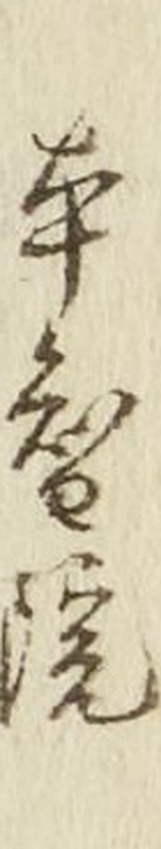本智院

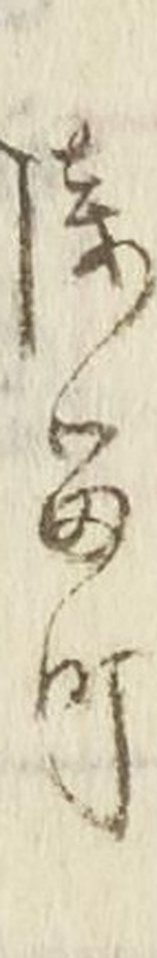浅留町
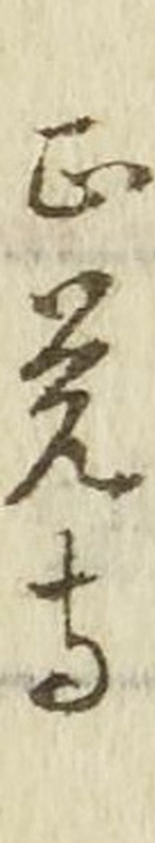正覚寺

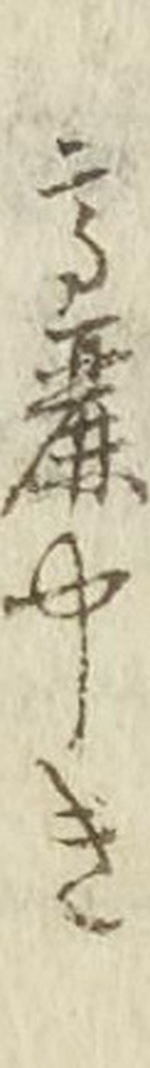高麗やしき

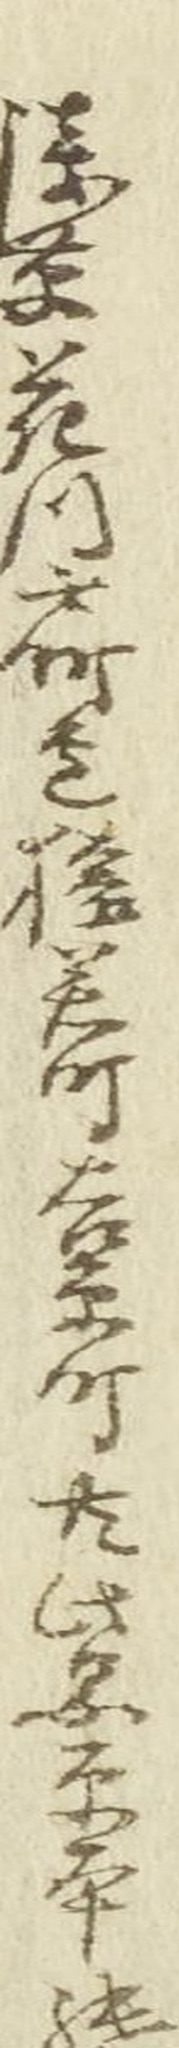浅草花川戸町辺猿若町吉原町共此図原本継紙ニ而
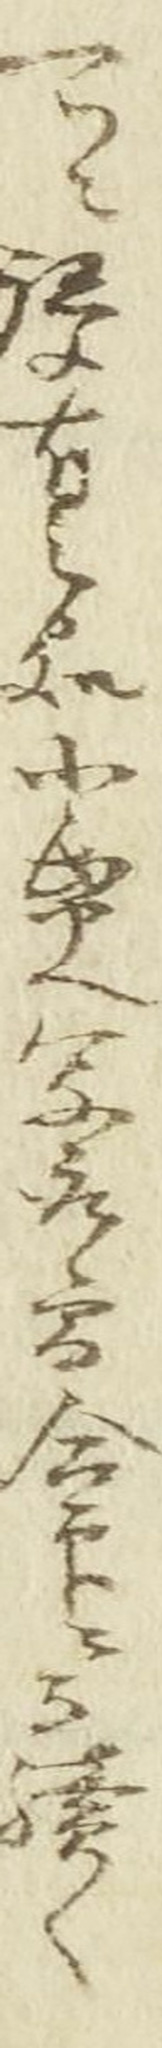一ツニ繋有之候処小紙へ写取候間合印ニ而続く

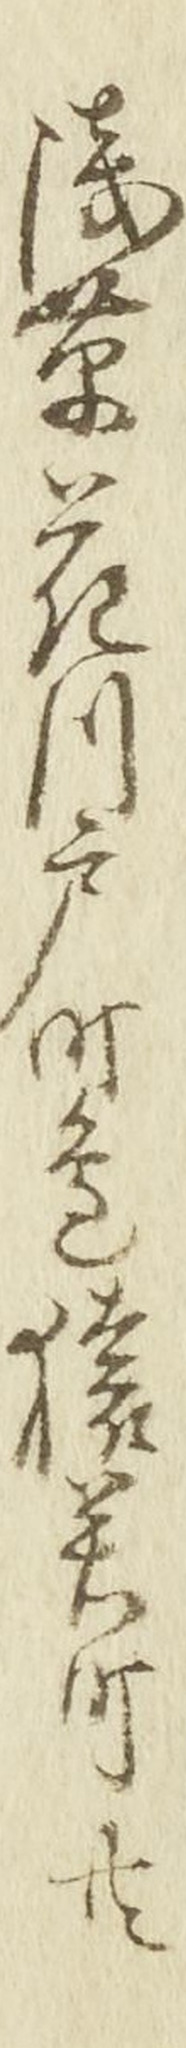浅草花川戸町辺猿若町共

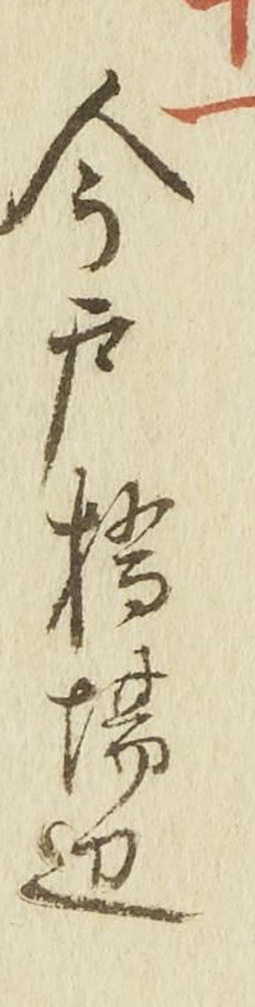今戸橋場辺

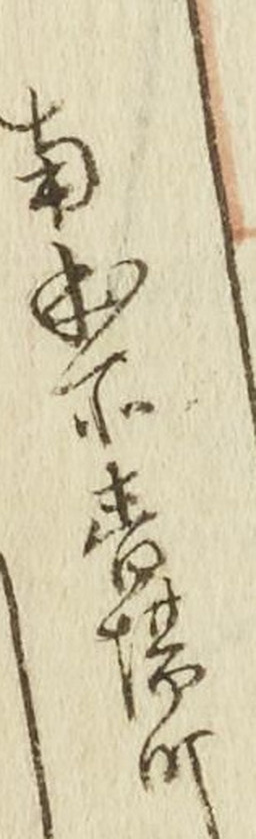南本所番場町
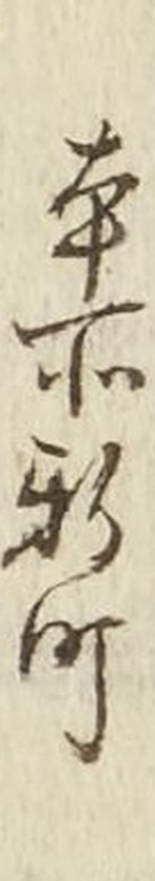本所新町

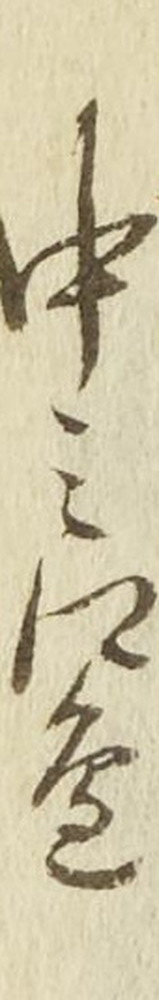中之郷辺
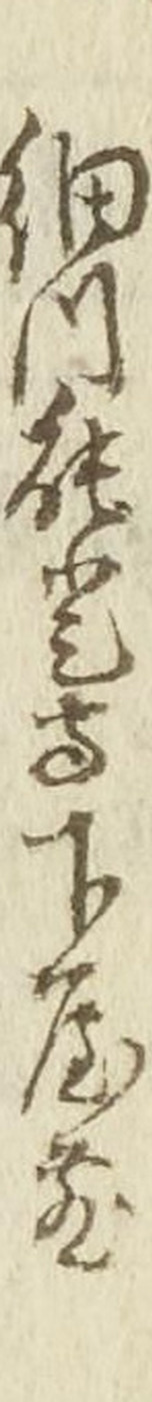細川能登守下屋敷西
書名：安政二年震災記事　完
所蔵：東京大学地震研究所図書室 Earthquake Research Institute Library, The University of Tokyo, JAPAN
